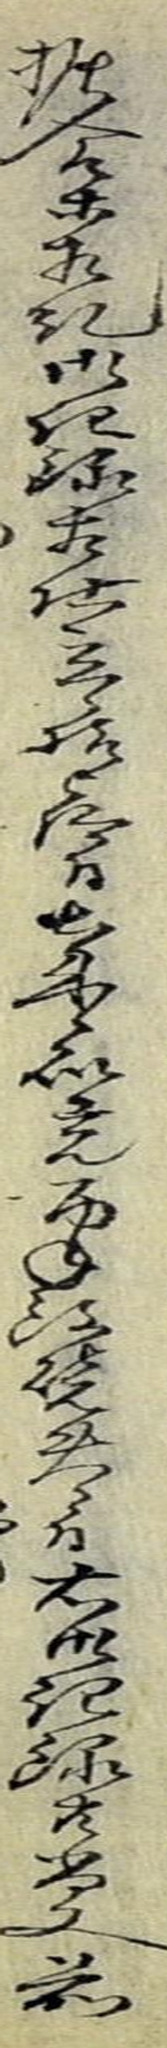振合等相糺追々相仕立候様被仰付出来候処去酉年致焼失に付右御記録共尚又前
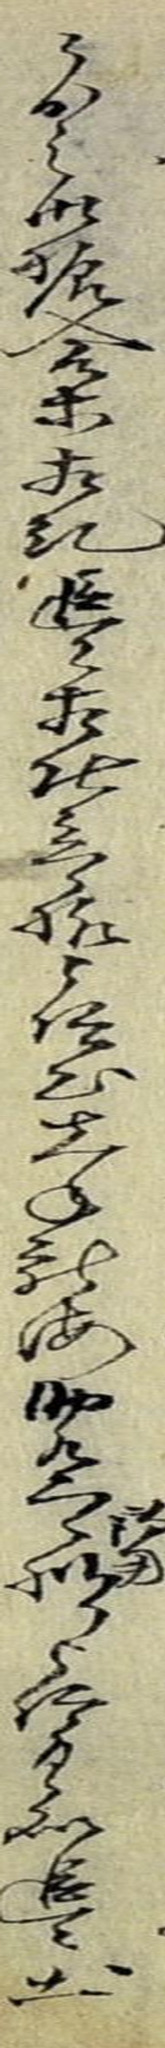々ゟ之御振合等相糺追々相仕立候様被仰出先年新海助左衛門御用掛り被仰付候処追々出
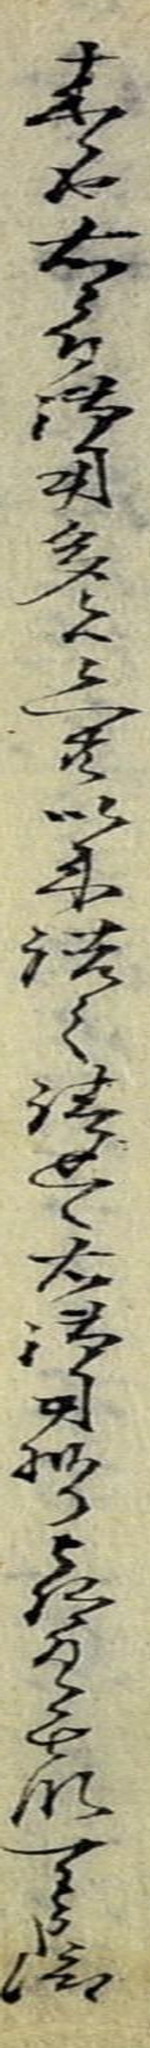来候由右に付御用多には候へ共以来詰之請込候右御用掛り被仰付候其段可被申渡候
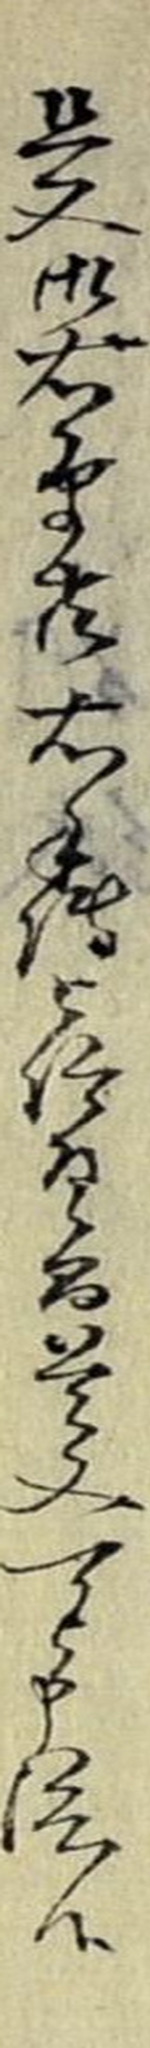且又御右筆共右手伝被仰付候間是又可被申渡候
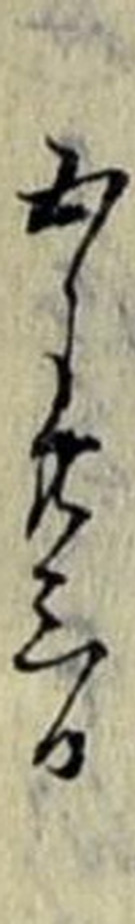五月廿三日
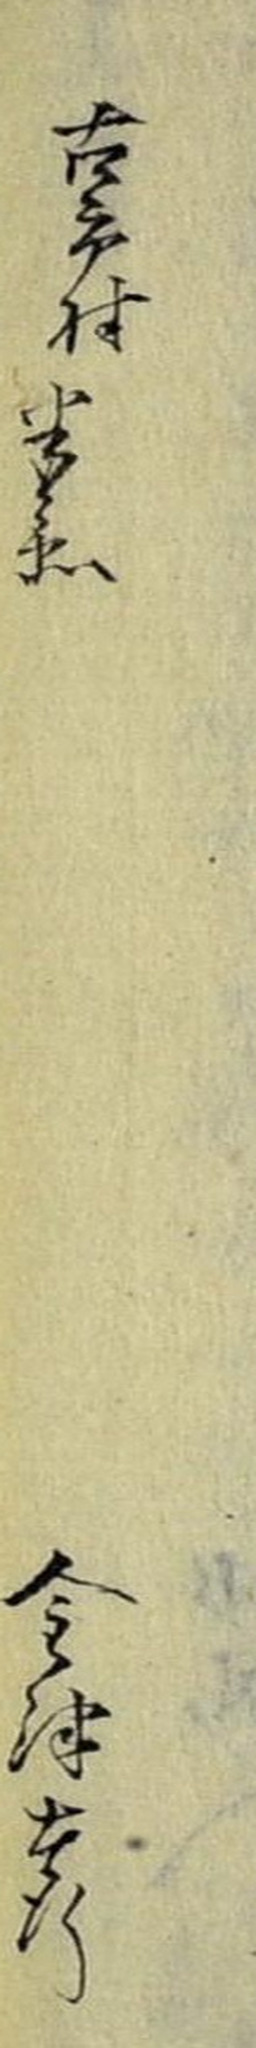古市村半兵衛金津奉行
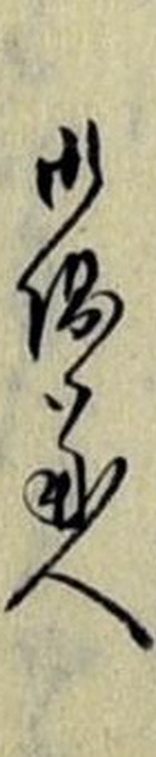御側御用人
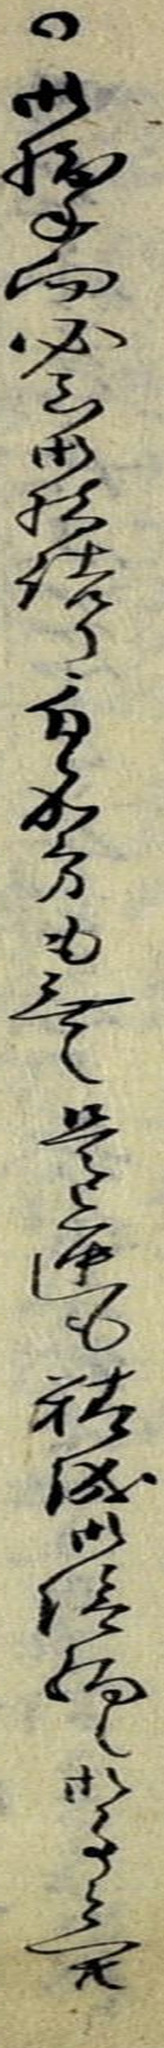○御勝手向必至御指詰りに付被成方も無之是迄迚も精誠御倹約之御事に候へ共
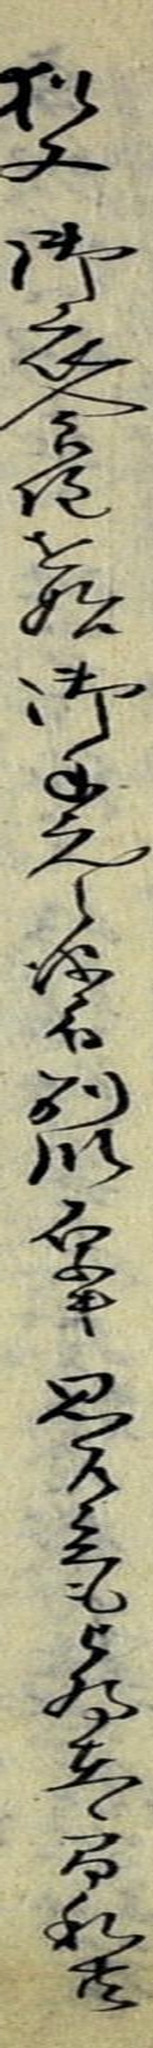猶又御衣食住を始御手元之儀に付別段厚キ思召立も被為在候間私共
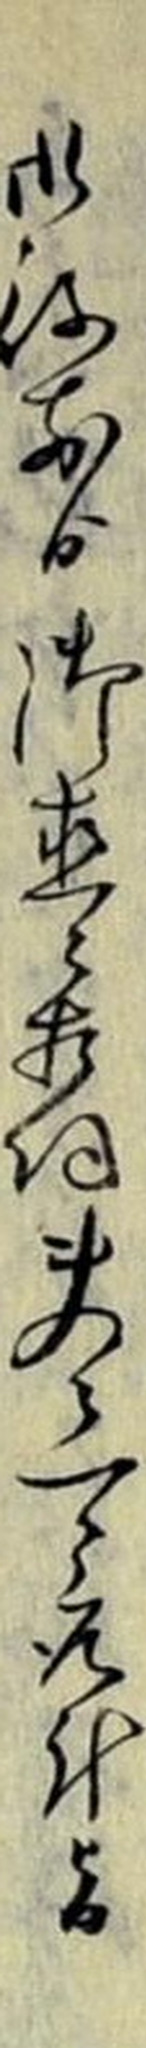御役前ゟ御直に相伺夫々可取斗旨
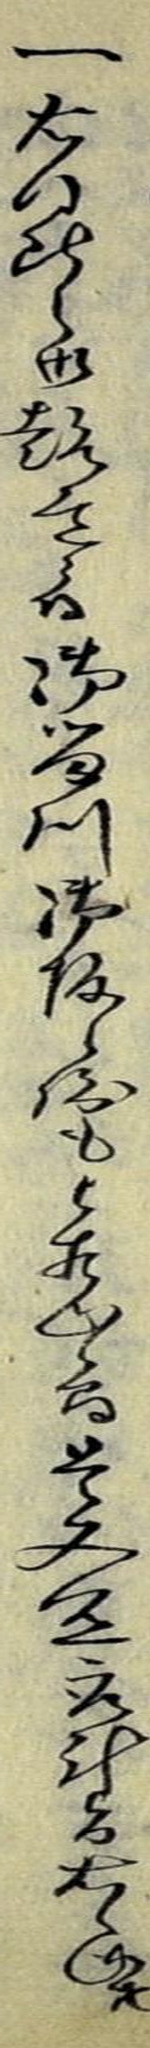一右同断之御趣意に付御留川御扱之儀も被相止候間是又宜取斗旨右之趣共
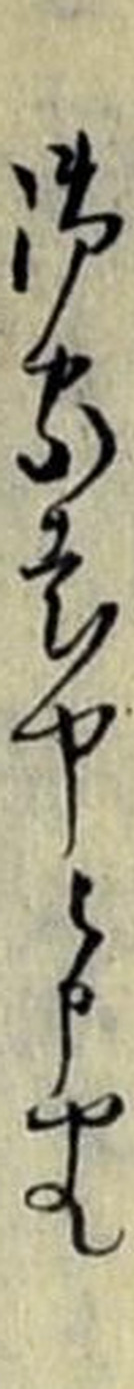御家老中被申聞候
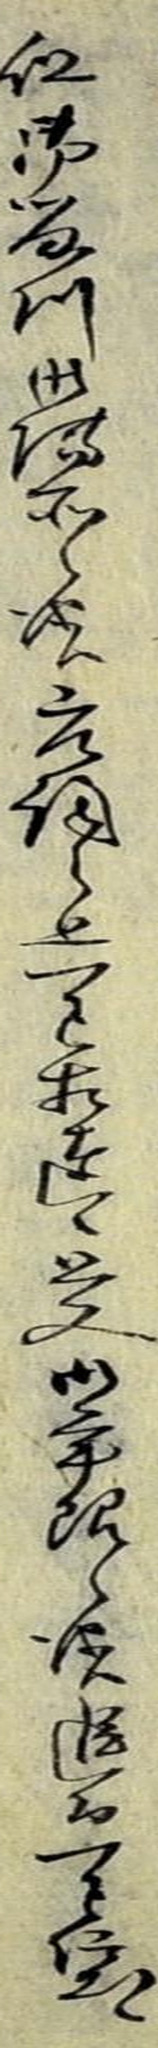但御留川御場所之儀は取調之上可被相達候且又御年限之儀は追而可被仰出候
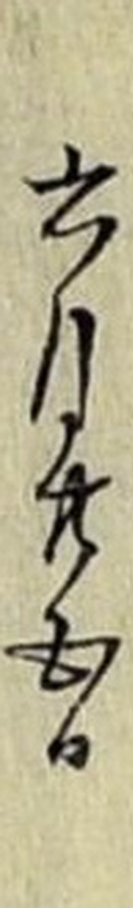六月廿五日
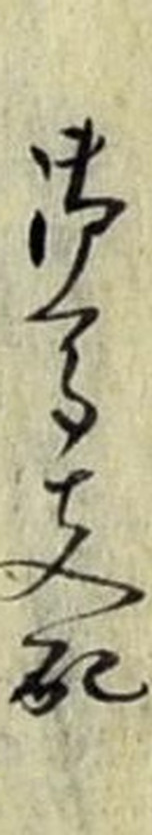御馬支配
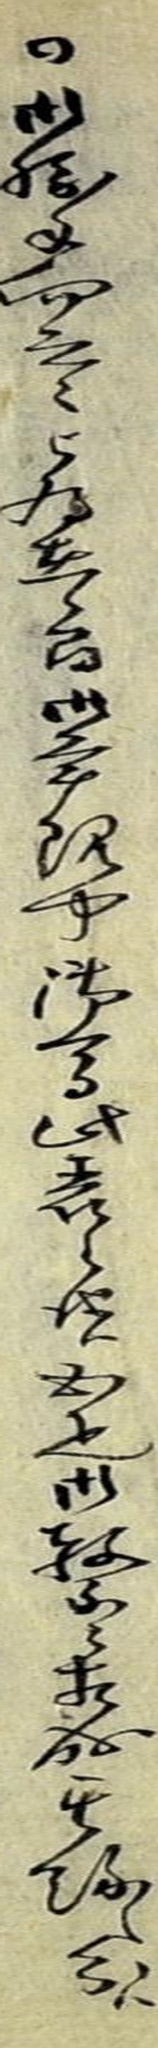○御勝手向云々被為在候間御年限中御馬此表之儀は五疋御繋に相成其餘之分は
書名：命令之部 六
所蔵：福井県文書館 Fukui Prefectural Archives
